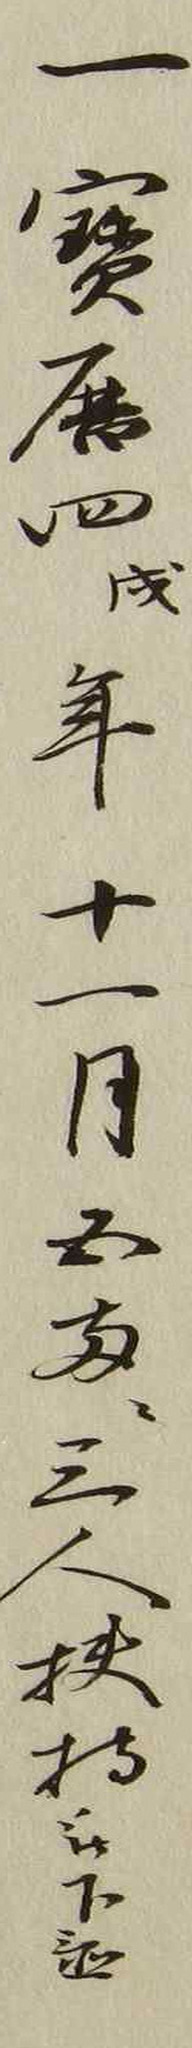一宝暦四戌年十一月五両ニ三人扶持下し置かれ
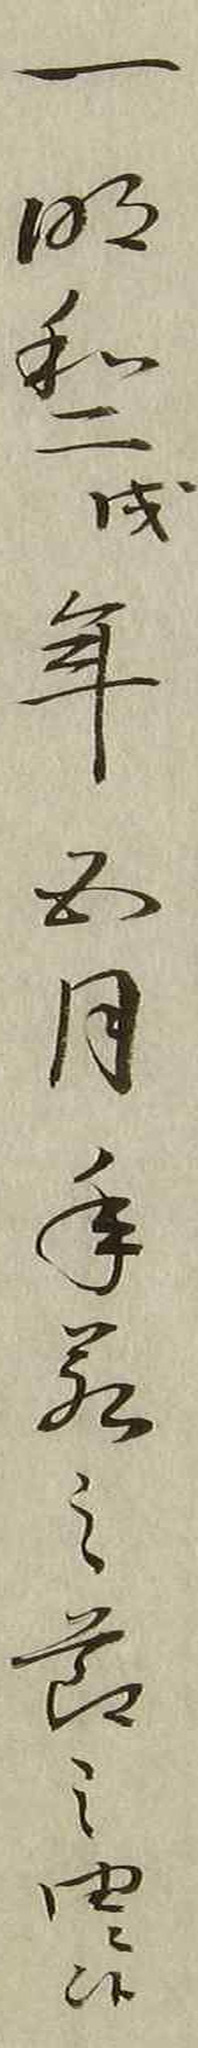一明和二戌年五月年若之節之由ニ候
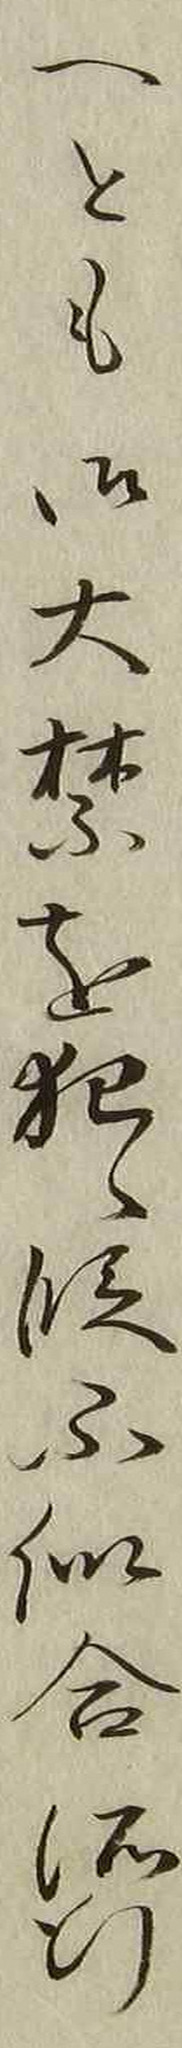へとも御大禁を犯候段ふ似合い所行
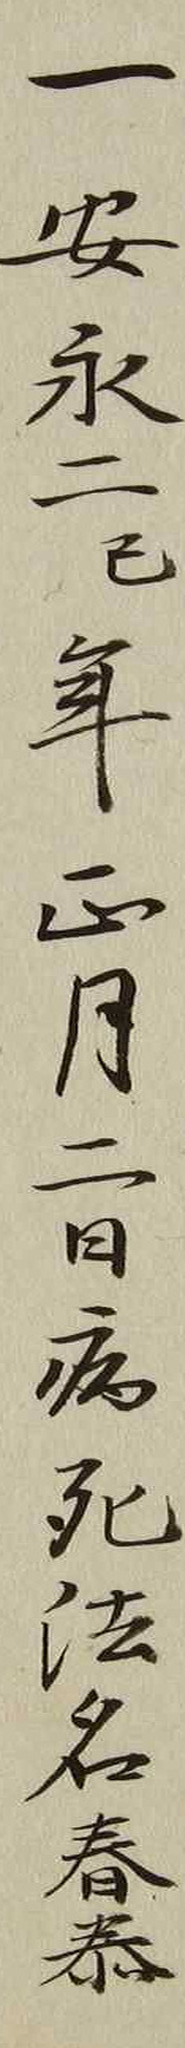一安永二巳年正月二日ひ病死法名春泰
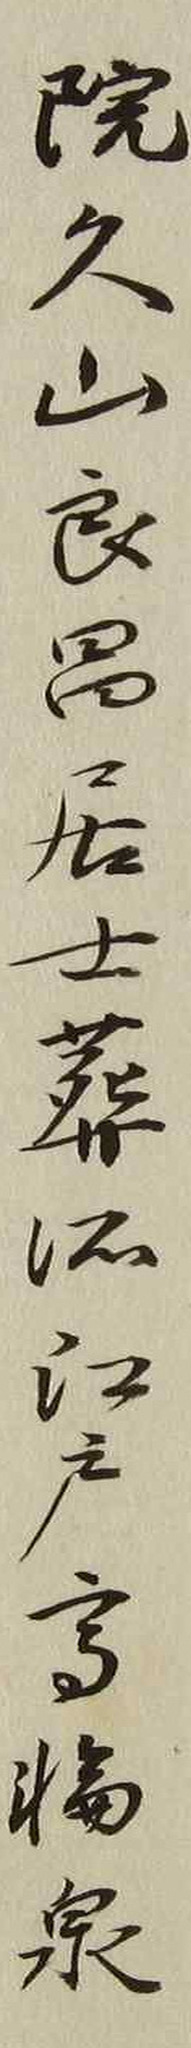院久山良昌居士葬所えと江戸高輪泉
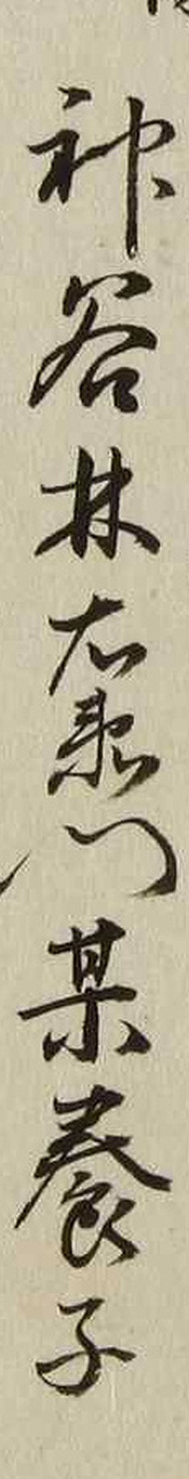神谷林右衛門某養子
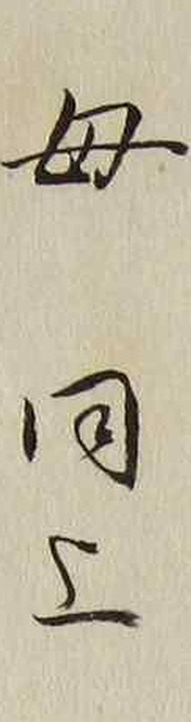母同上
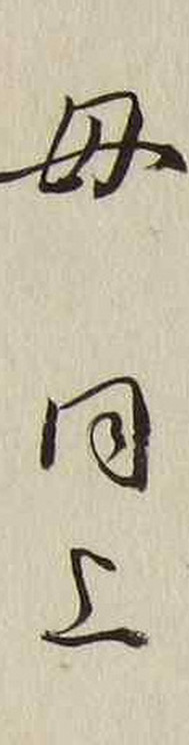母同上

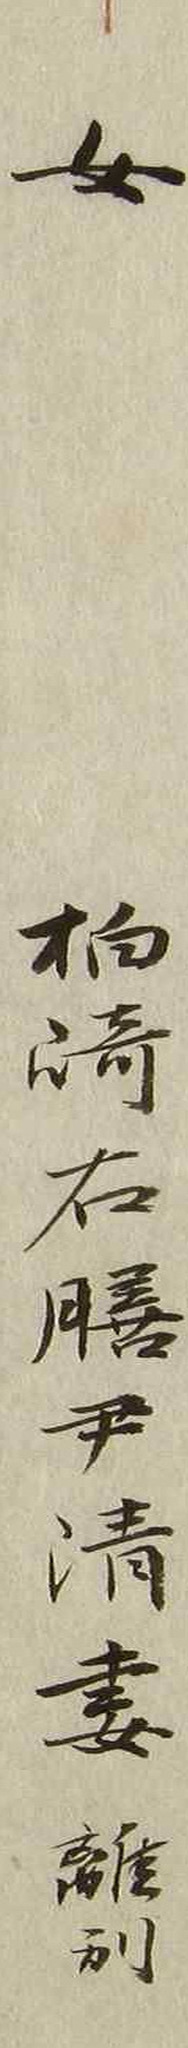女柏崎右膳尹清妻離別
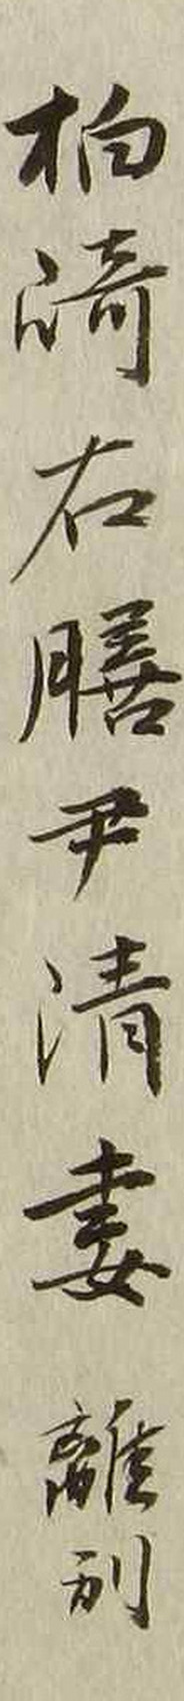女柏崎右膳尹清妻離別
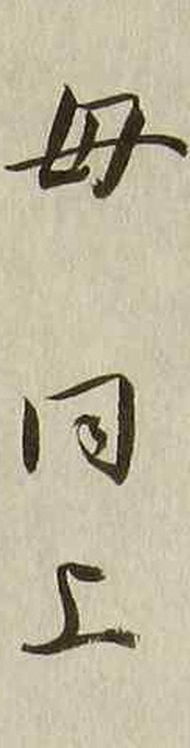母同上
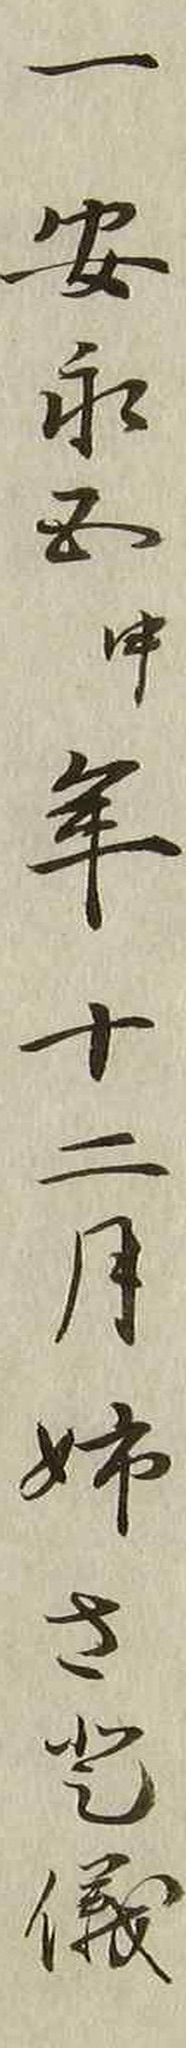一安永五申年十二月姉さと儀
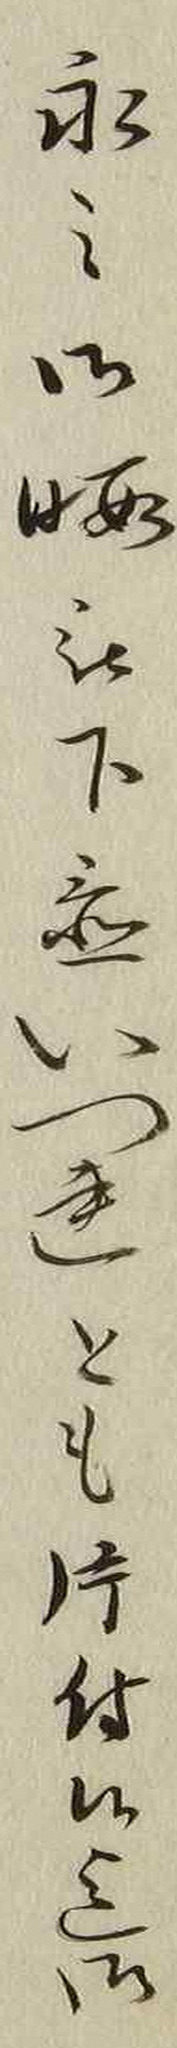永々御暇下し置かれいづれとも片付き候迄御
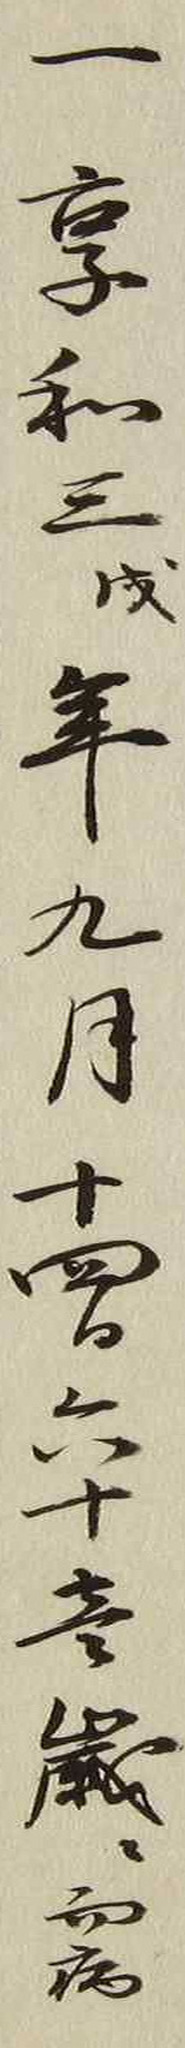一享和三戌年九月十四日六十壱歳ニて病
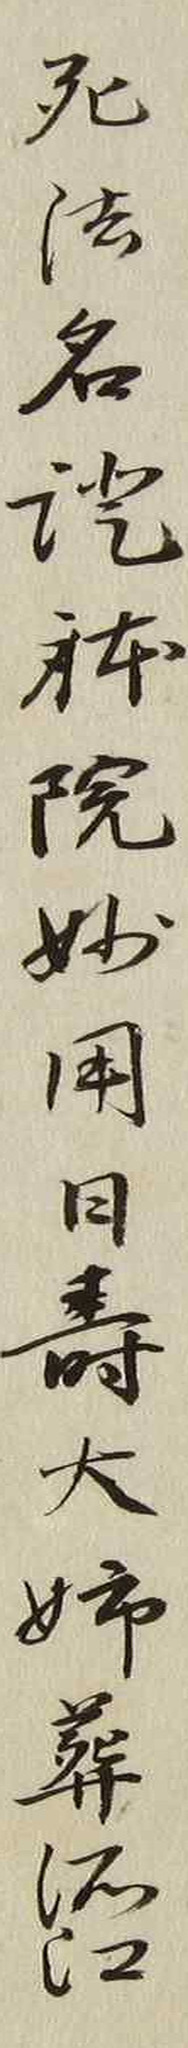死法名證体院妙用日壽大姉葬所江
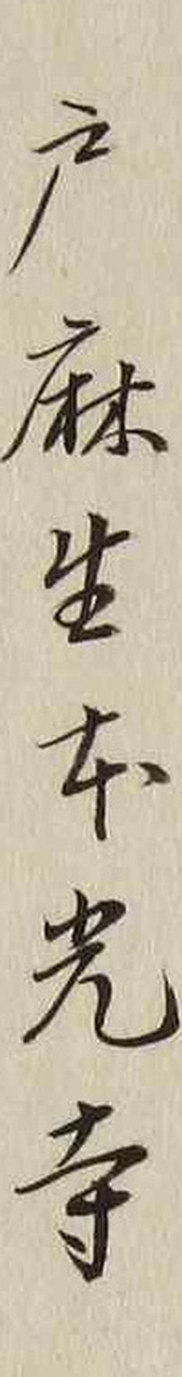戸麻生本光寺
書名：諸士系譜　巻之19　い之部19
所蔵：会津若松市立会津図書館
